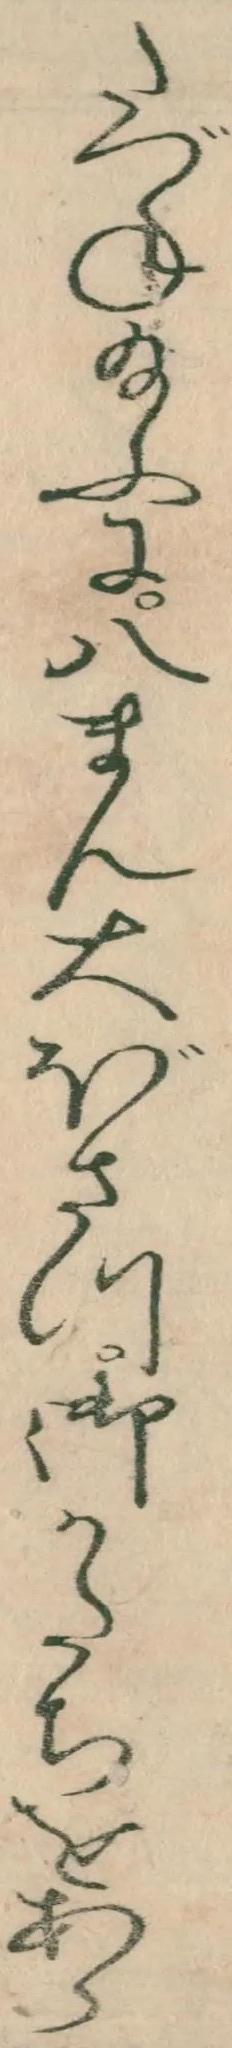たづね給ふに。八まん大ぼさつ。御かたちをあら
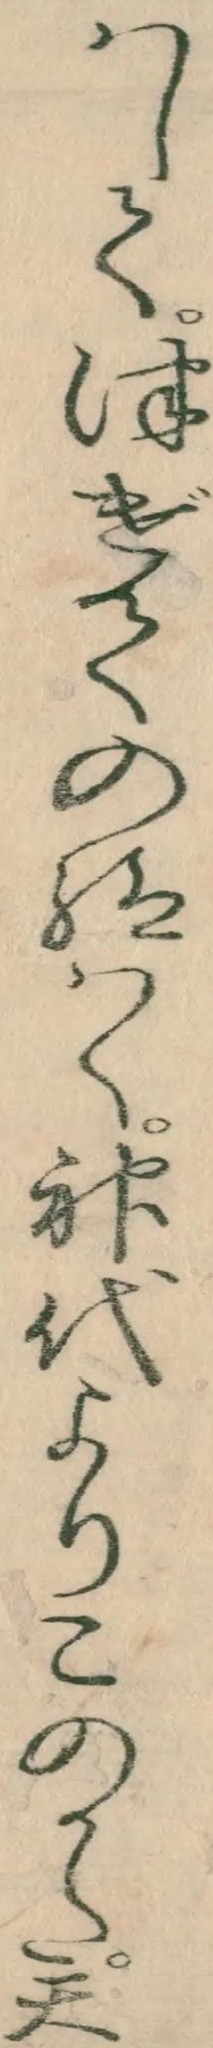はして。つけての給はく。神代よりこのかた。天
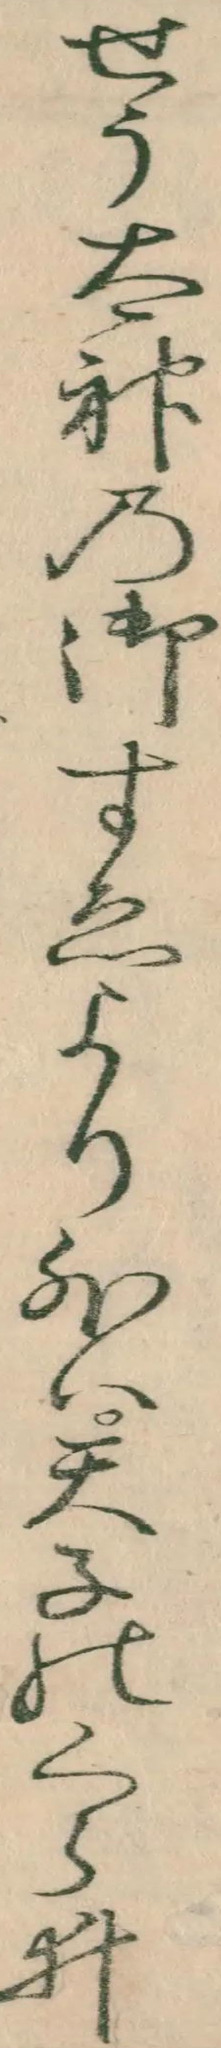せう太神の恩すゑより外は。天子のくらゐ
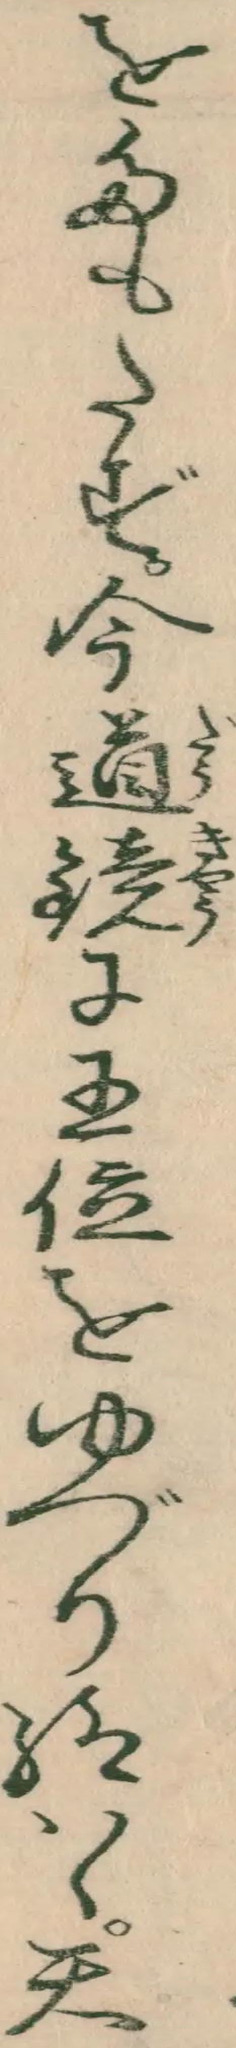をたもたず。今道鏡に王位をゆづり給はゝ。天
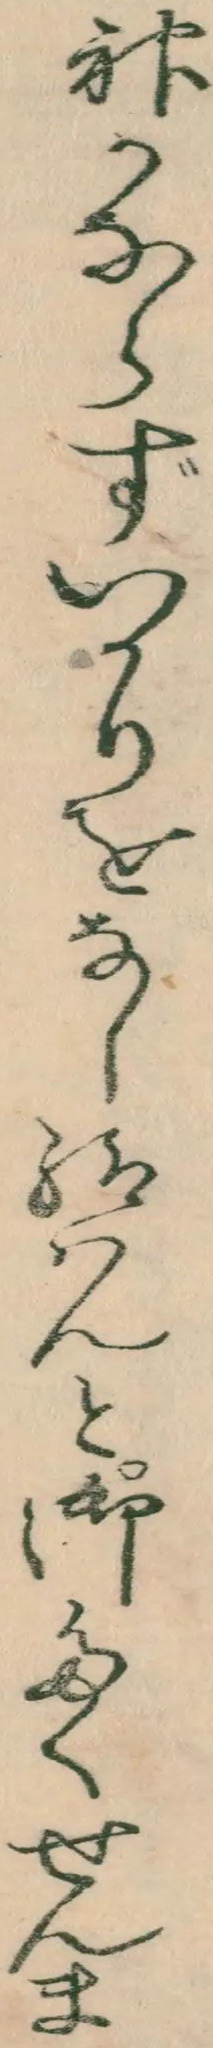神かならずいかりをなし給はんと。御たくせんま
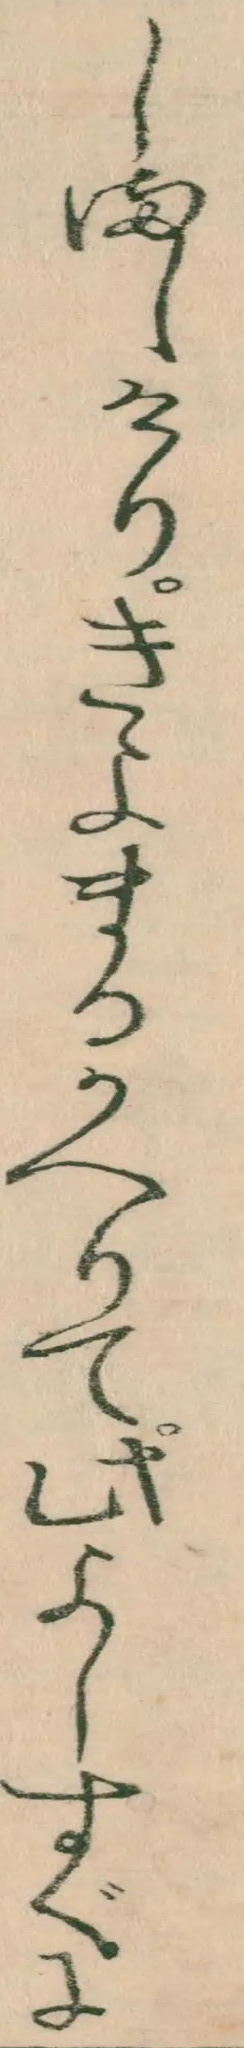しましけり。きよまるかへりて。此よしすぐに
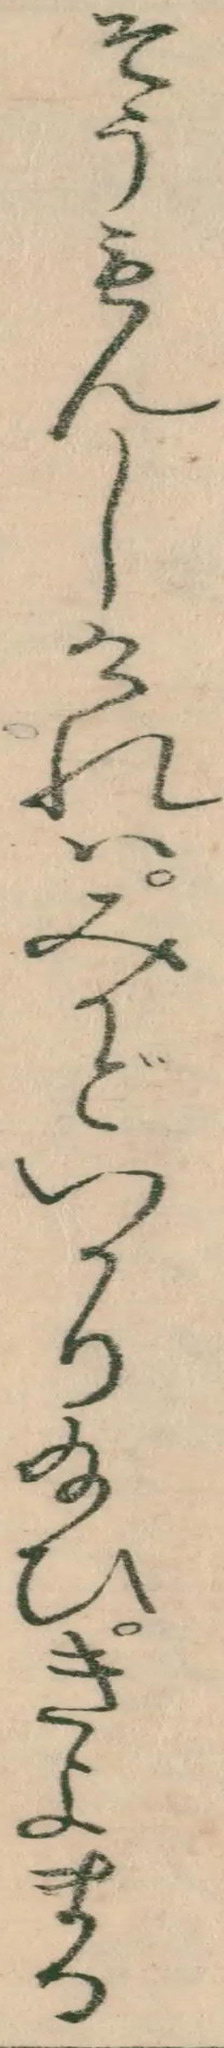そうもんしけれは。みかどいかり給ひ。きよまる
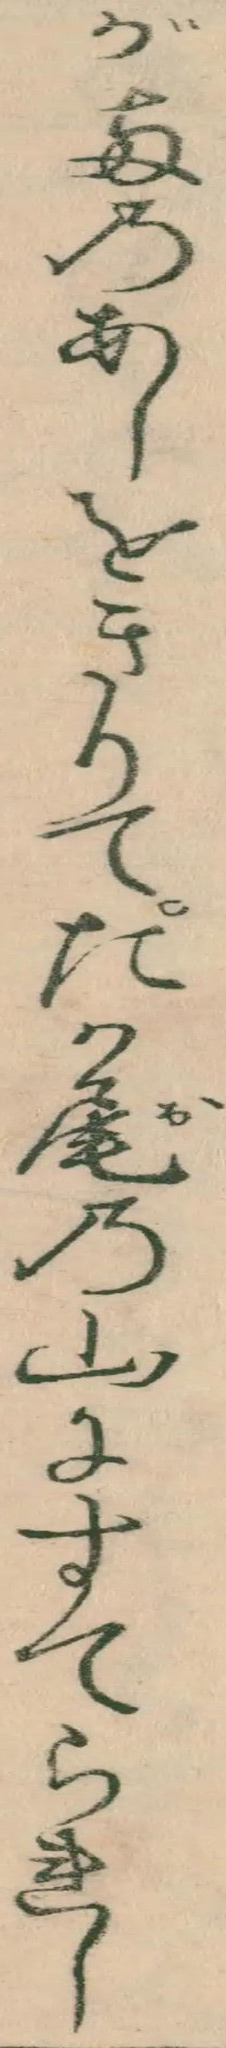が両のあしをきりて。たか尾の山にすてられし
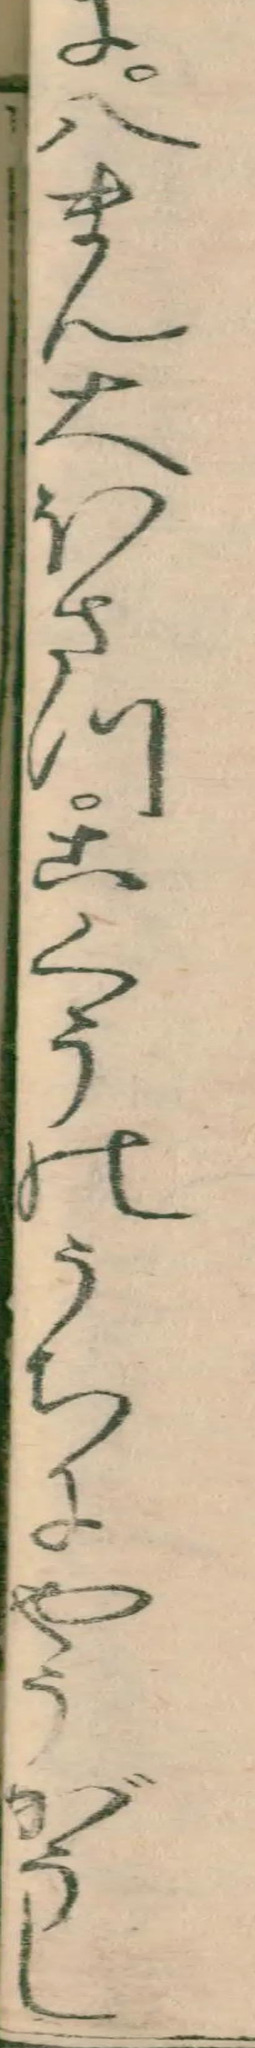に八まん大ほさつ。こくうのうちにやうがうし
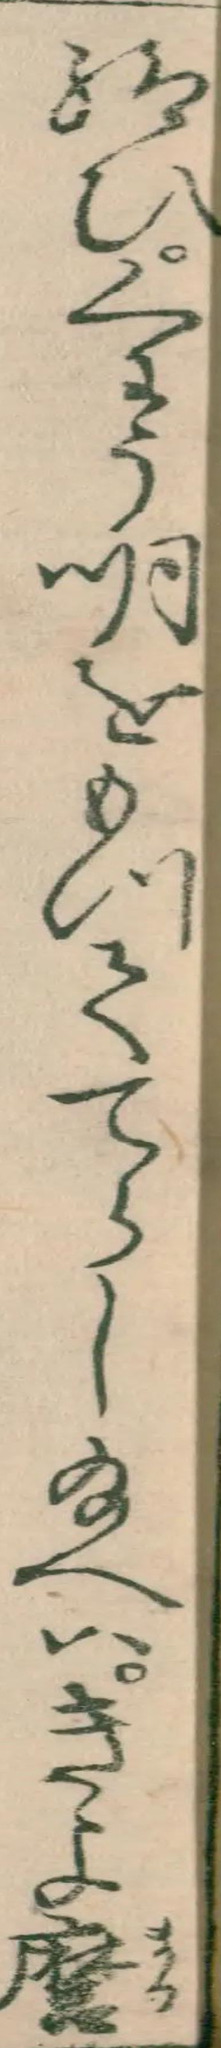給ひ。くわう明をもつててらし給へは。きよ麿
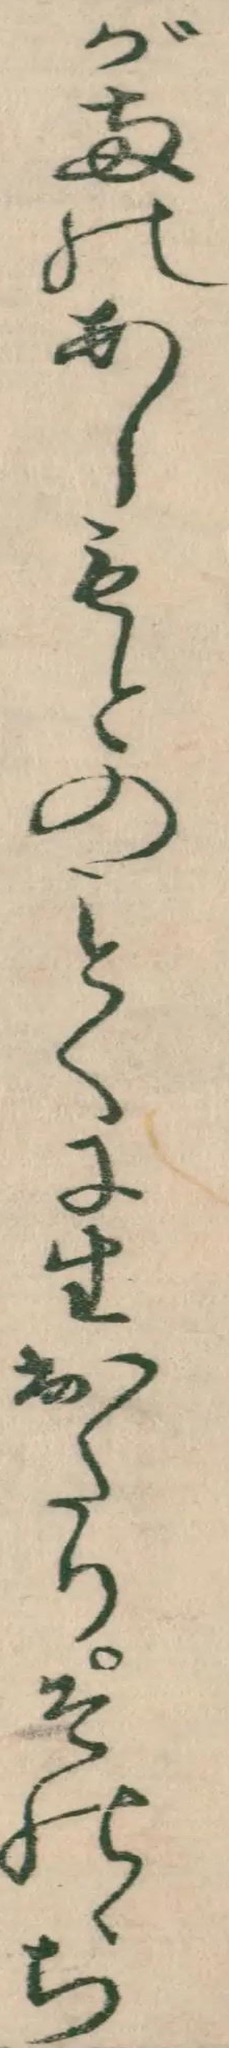が両のあしもとのことくに生出たり。そのゝち
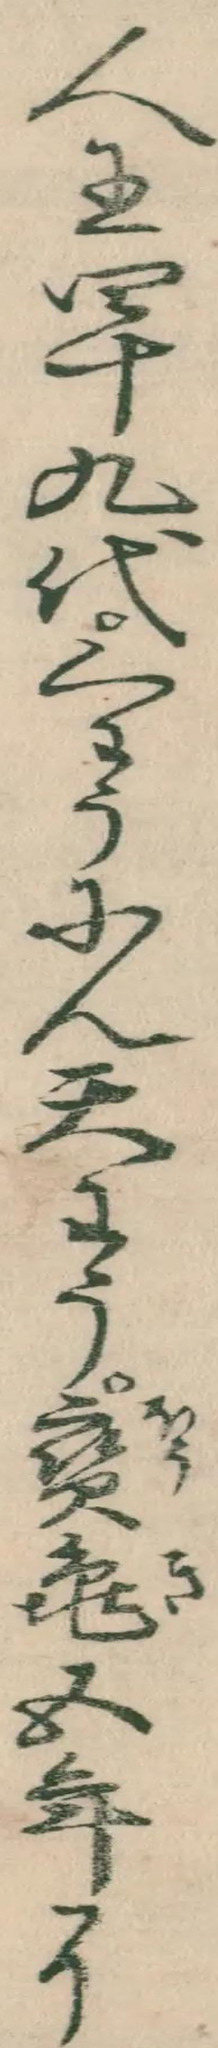人王四十九代。くわうにん天わう。宝亀五年に
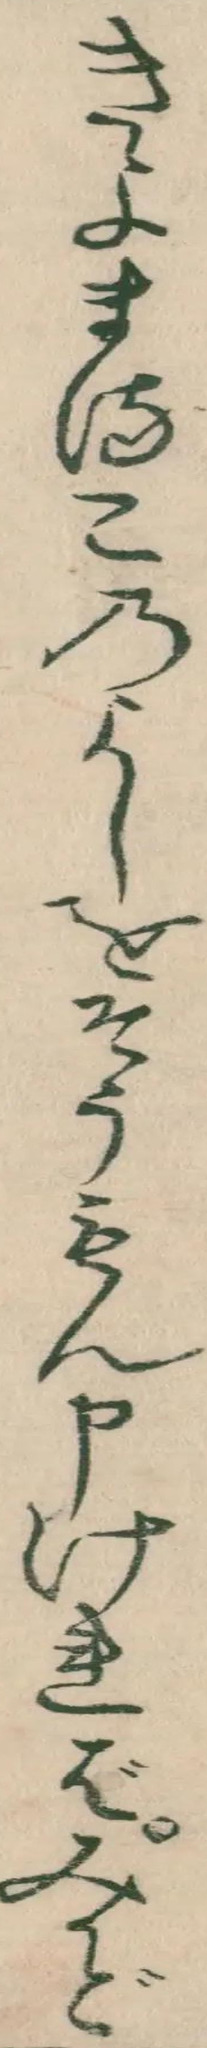きよまるこのよしをそうもん申ければ。みかど
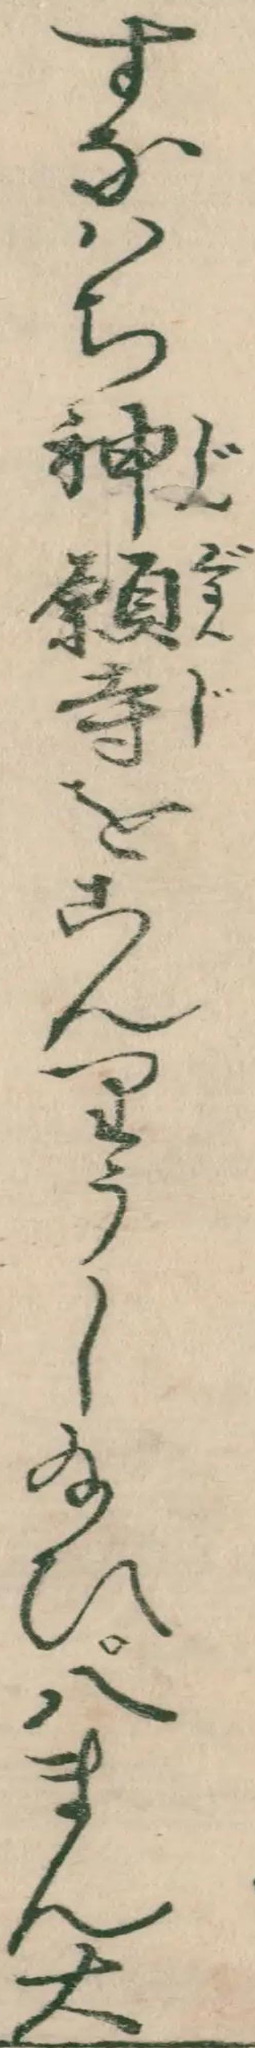すなはち神願寺をこんりうし給ひ。八まん大
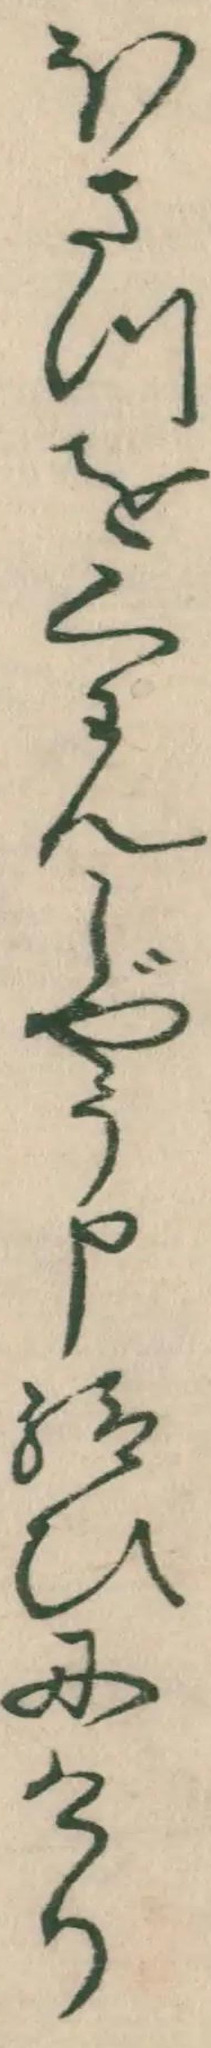ほさつをくわんじやう申給ひにけり

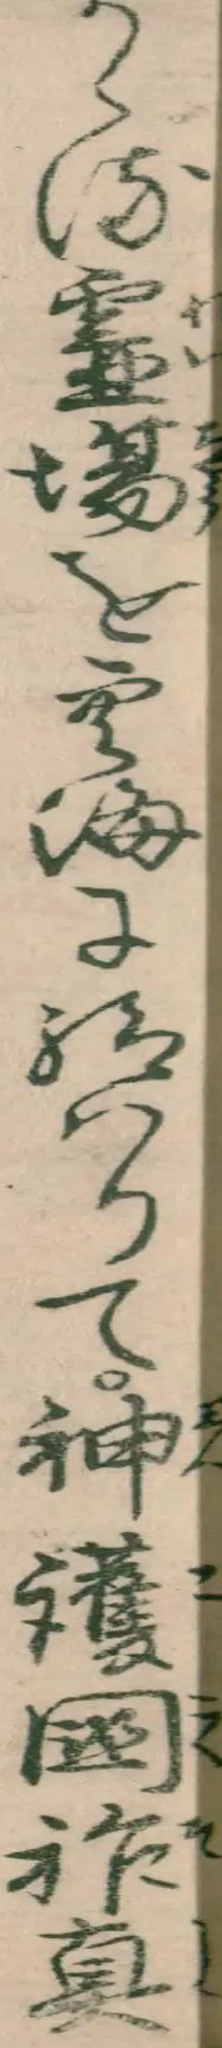かゝる霊場を空海に給はりて。神護国祚真
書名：弘法大師御本地 3巻. [3]
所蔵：国立国会図書館 National Diet Library, JAPAN
